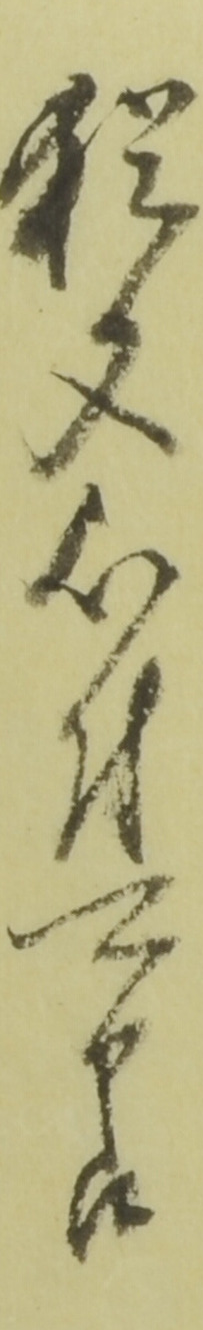猶又心付可申候
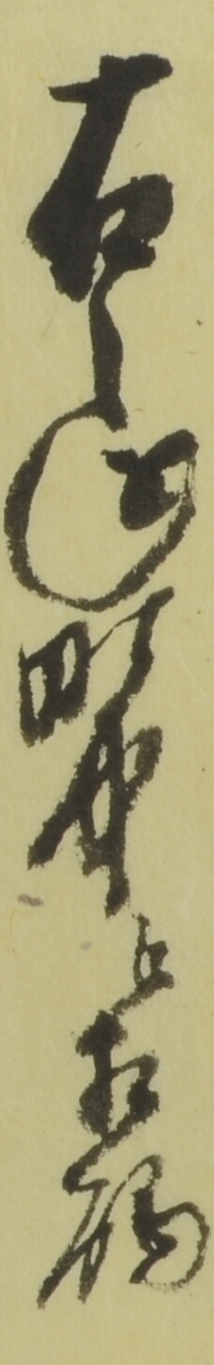右之趣町中江相触
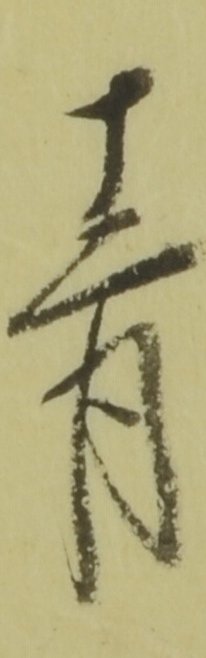十二月
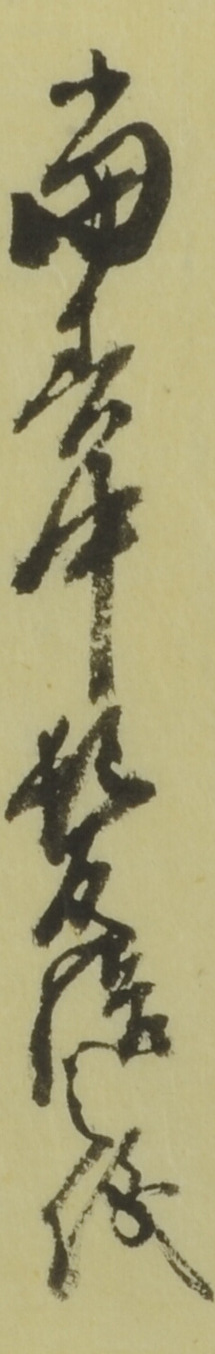当春中髪銭之儀
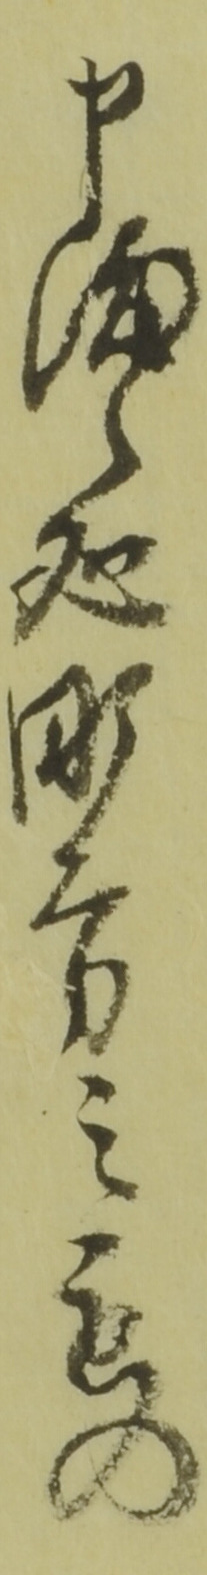申渡候処町方之もの
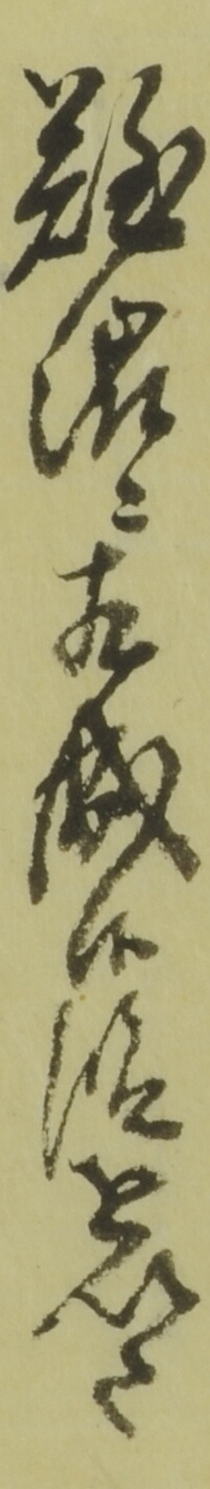難渋ニ相成候段を以て
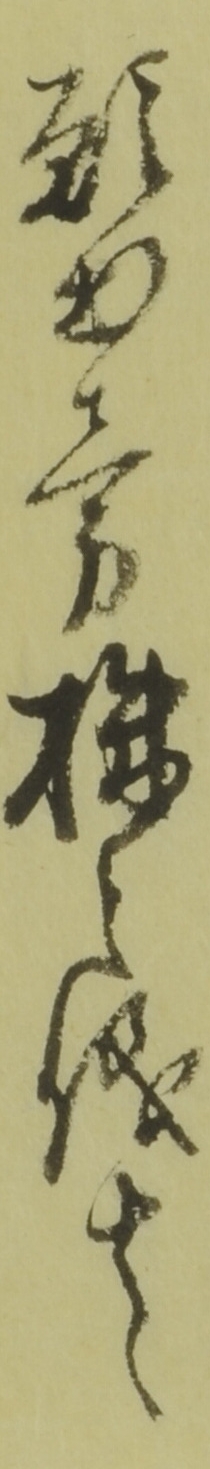願出旁株之儀は
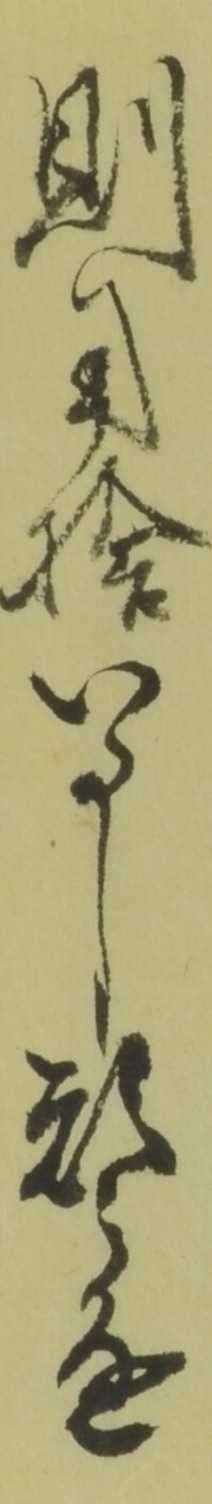則用捨いたし願之通
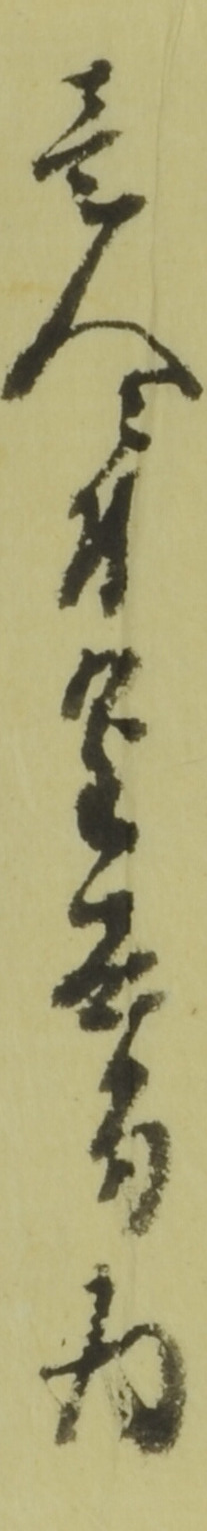壱人ニ付金壱両為
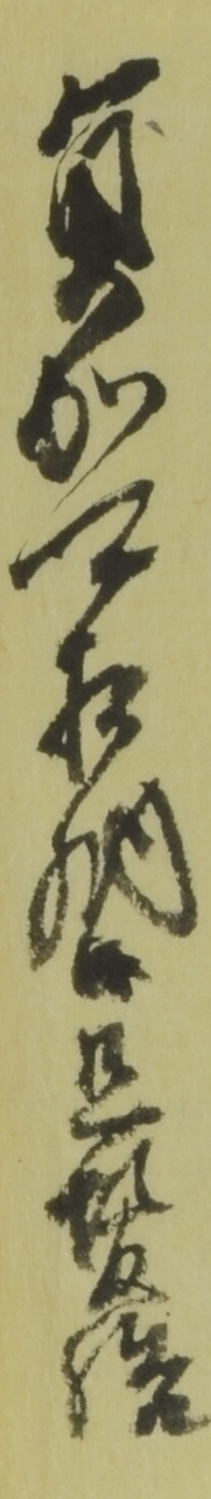冥加可相納候且髪結
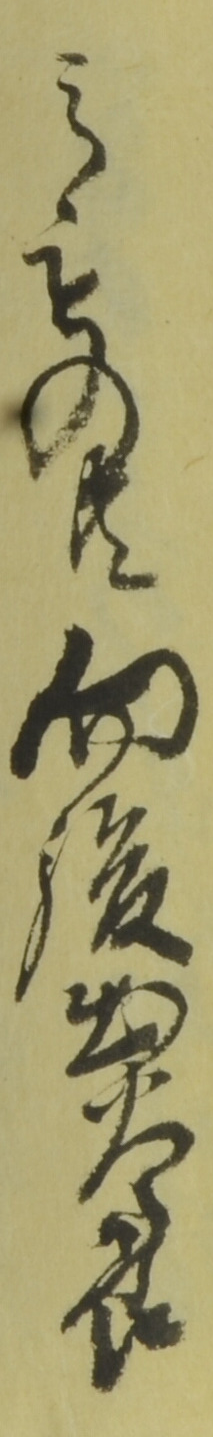之もの共向後出火之節
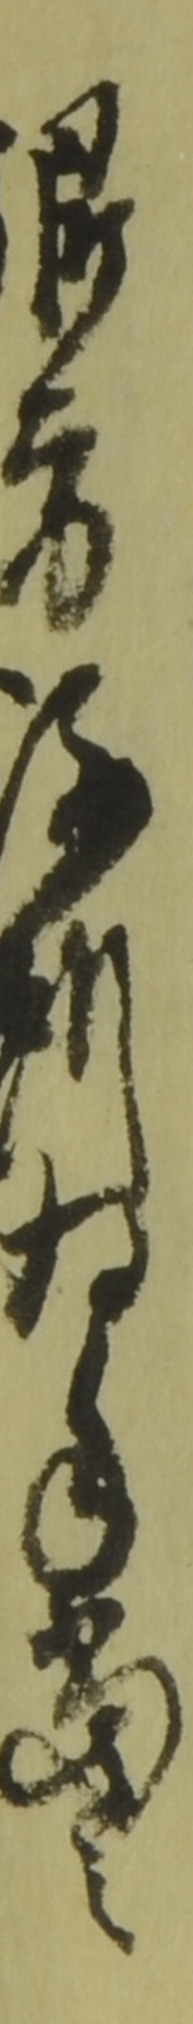銀方役所為手当之

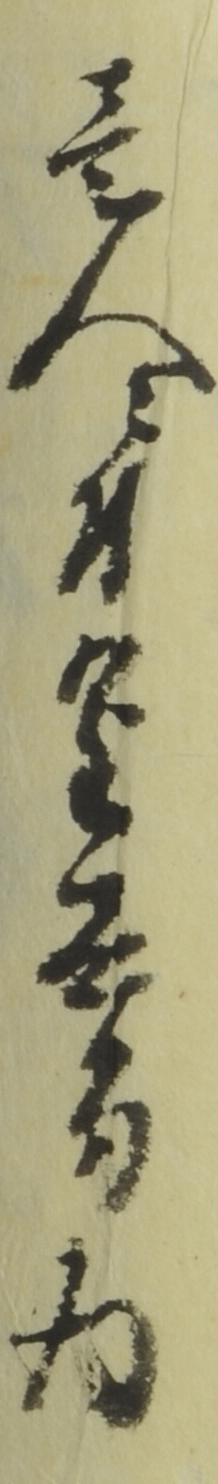壱人ニ付金壱両為
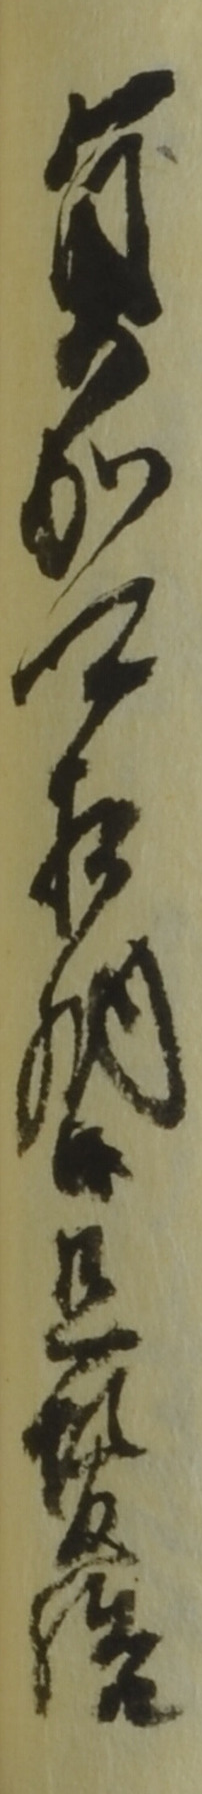冥加可相納候且髪結
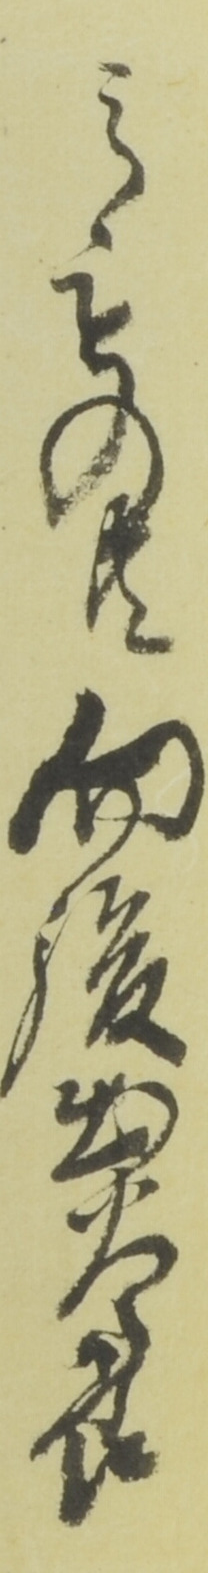之もの共向後出火之節
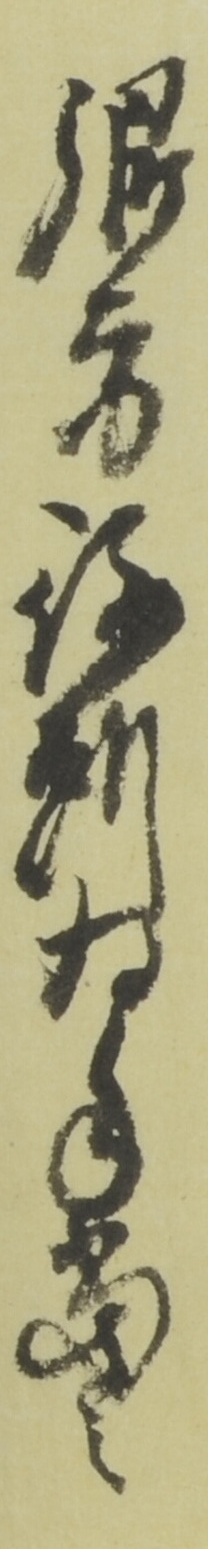銀方役所為手当之
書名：御触書御書附控
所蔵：伊那市立高遠町図書館・合同会社AMANE
